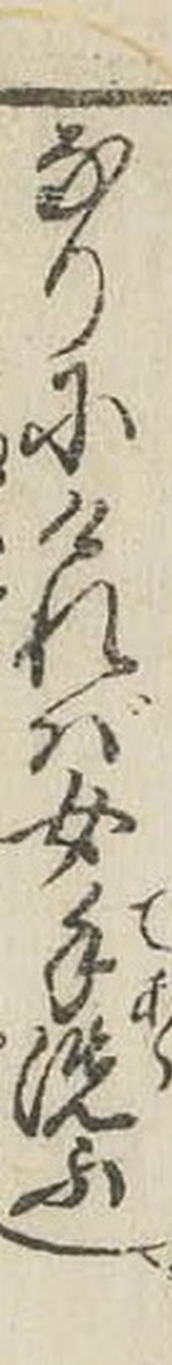なりにければ女手洗ふ
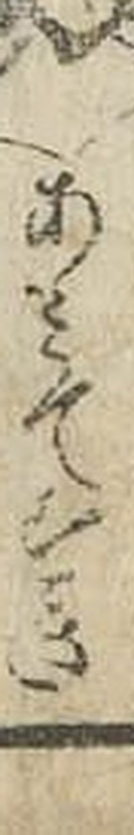あみてすき
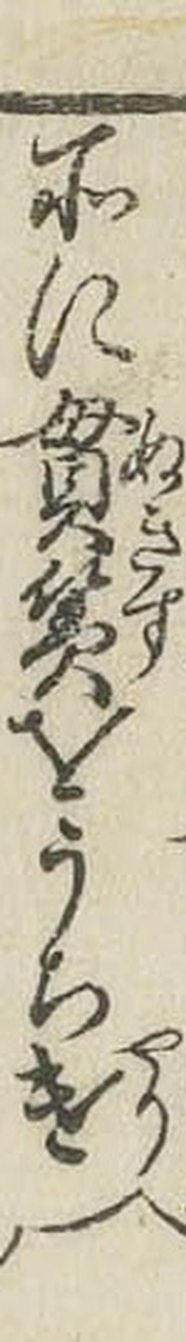所に貫簀をうち遣
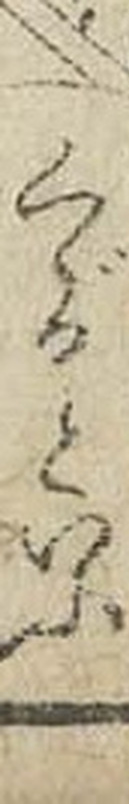くゞるといふ
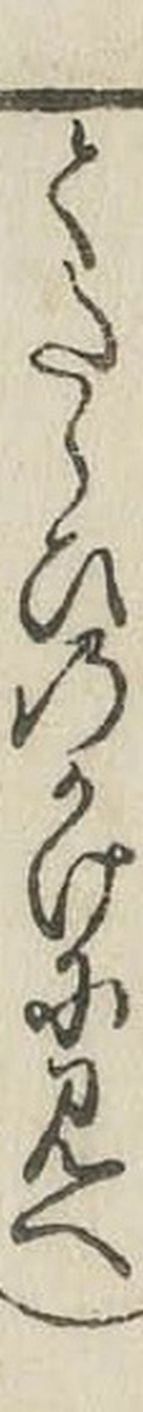てたらひのかけに見へ
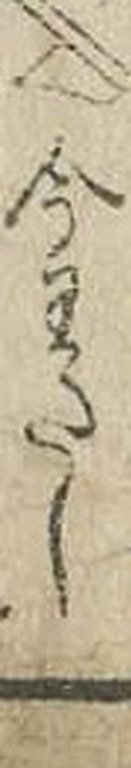今わたし
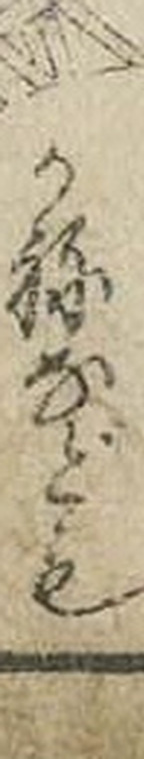かねなども
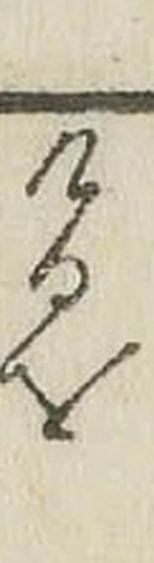けるを
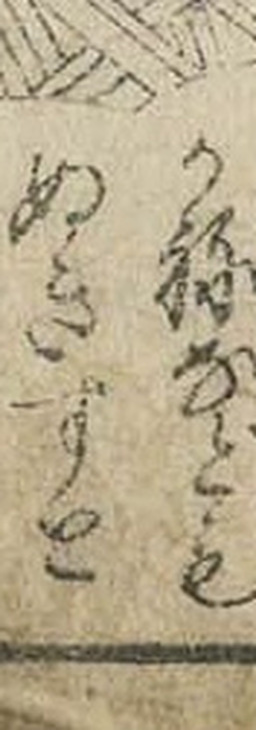ぬきすと
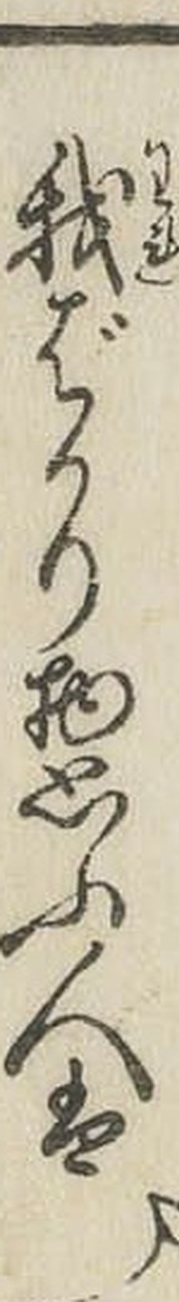我ばかり物思ふ人は
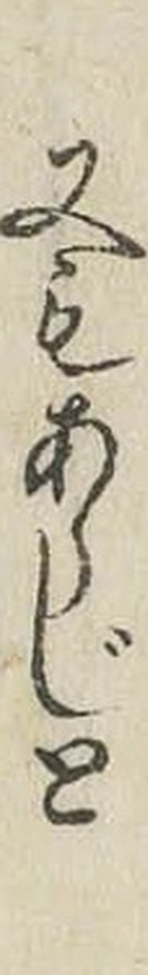又もあらじと
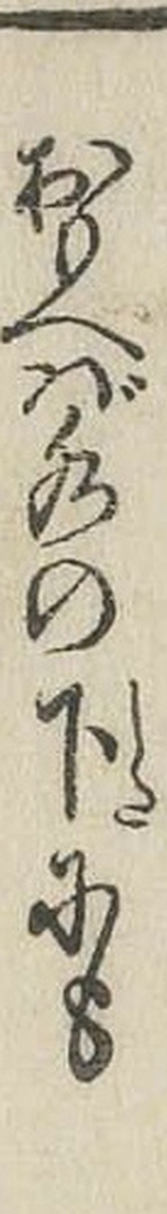おもへば水の下にも
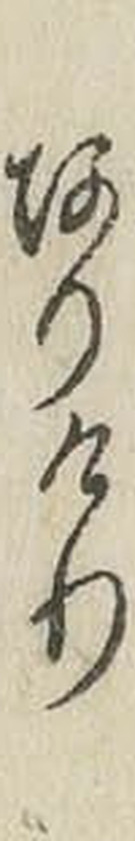ありけり
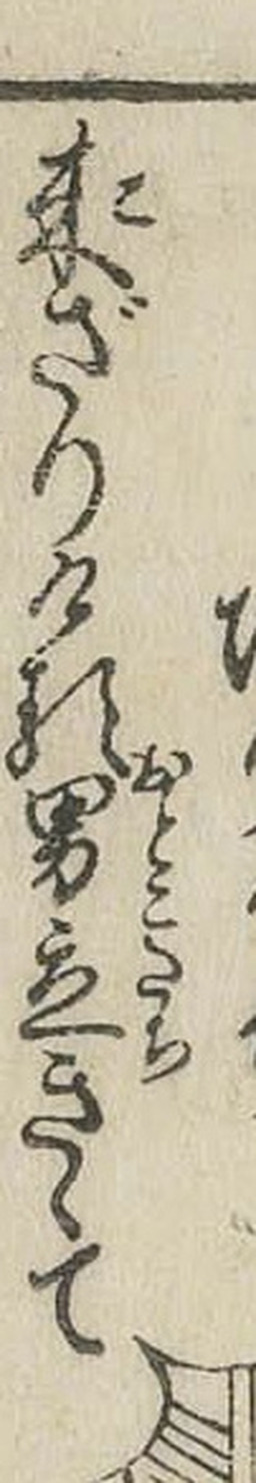来ざりける男立きゝて
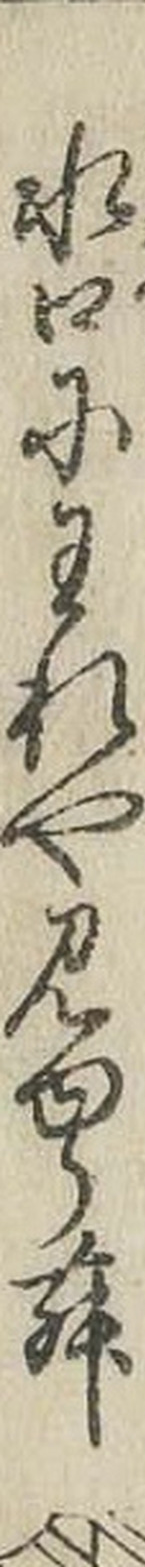水口にわれや見ゆらむ
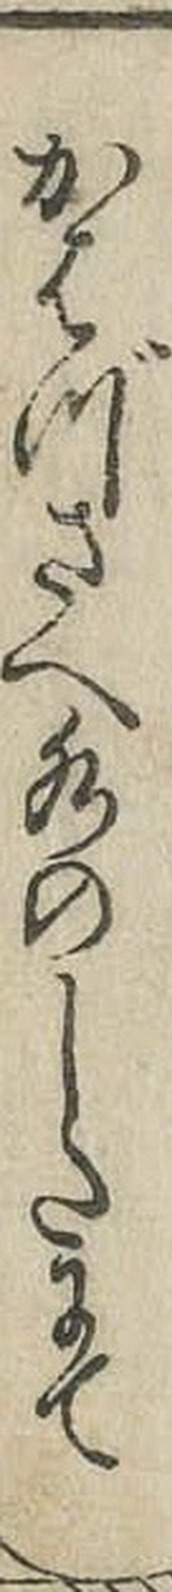かはづさへ水のしたにて
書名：絵本写宝袋 9巻 1之巻
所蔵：東京学芸大学教育コンテンツアーカイブ
